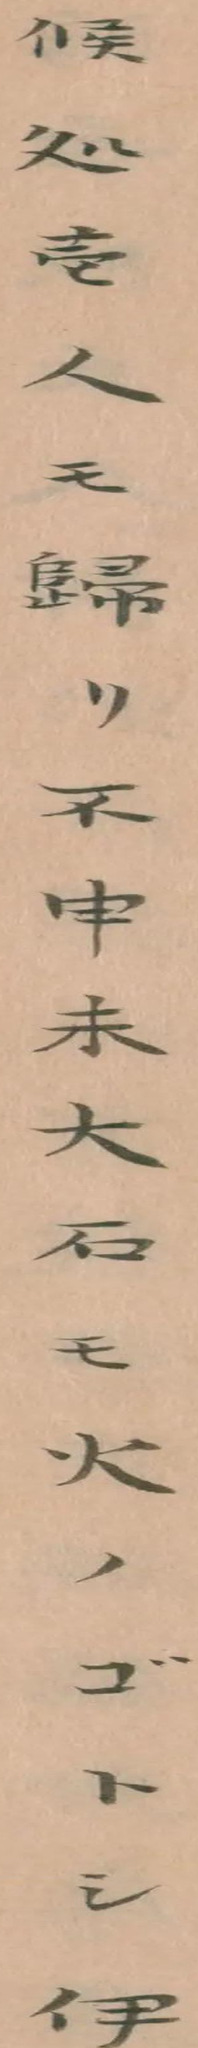候処壱人モ帰り不申未大石モ火ノゴトシ伊
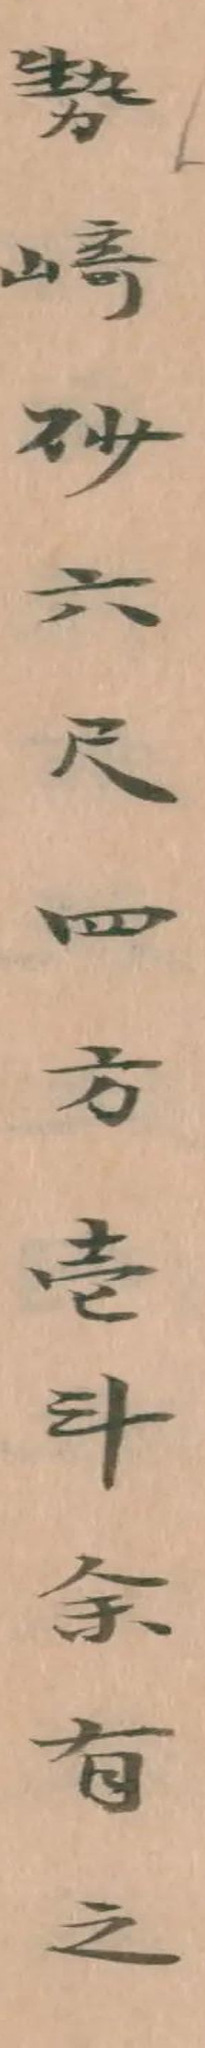勢崎砂六尺四方壱斗余有之
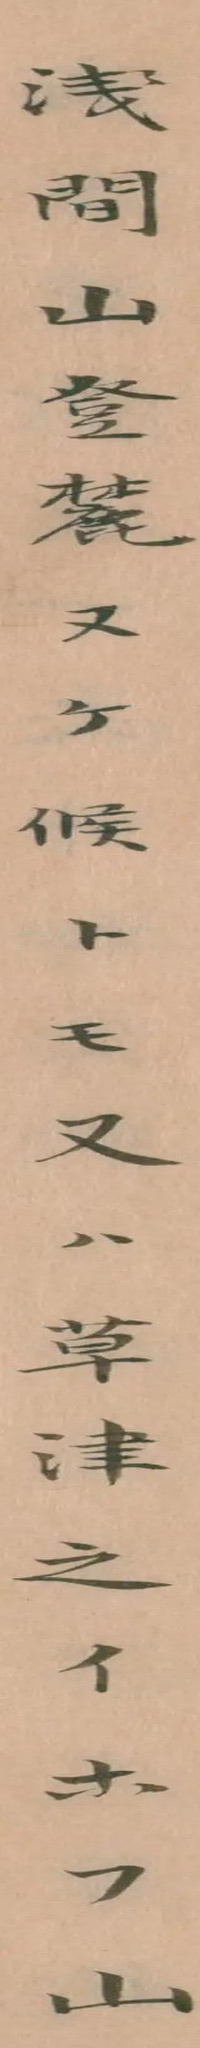一浅間山登麓ヌケ候トモ又ハ草津之イホフ山
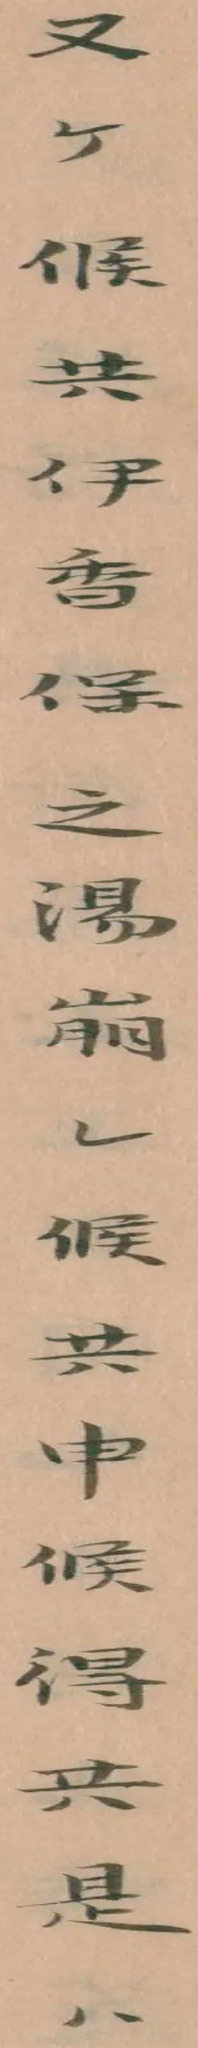ヌケ候共伊香保之湯崩レ候共申候得共是ハ
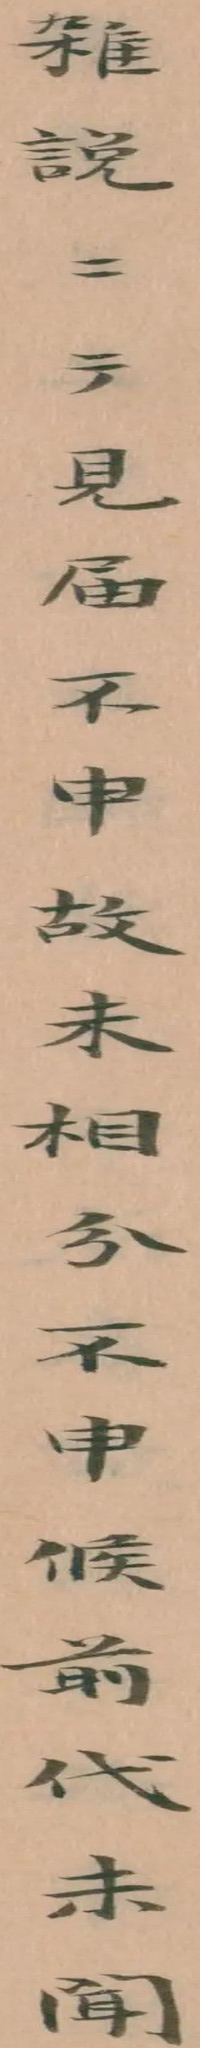雑説ニテ見届不申故未相分不申候前代未聞
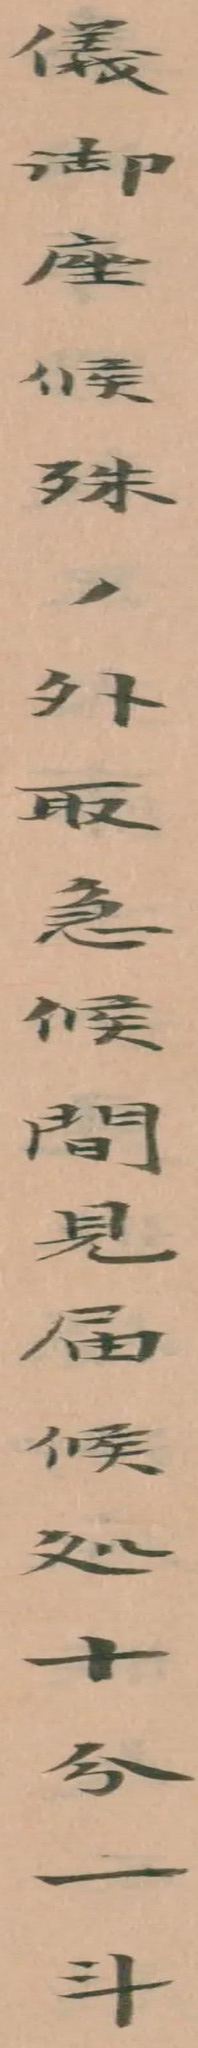儀御座候殊ノ外取急候間見届候処十分一斗
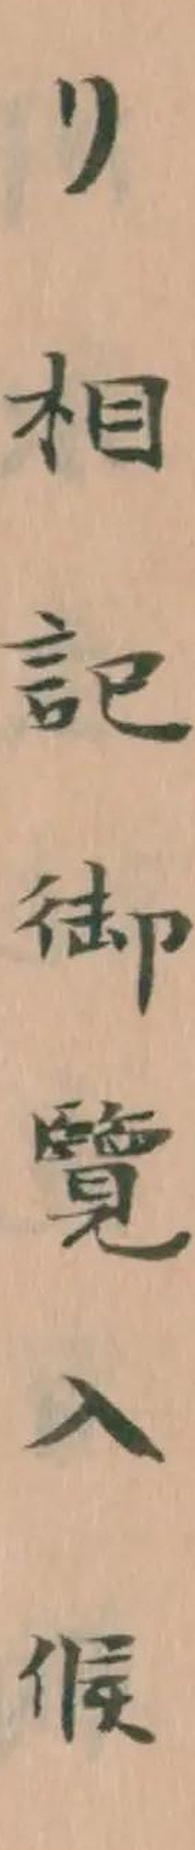リ相記御覧入候
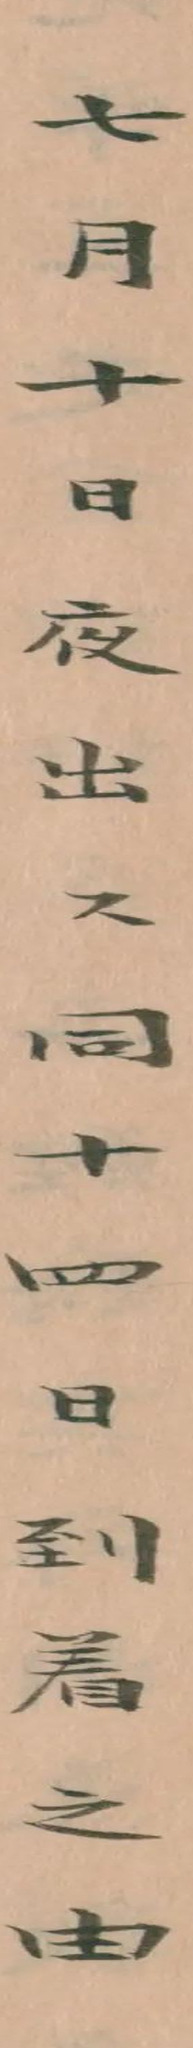七月十日夜出ス同十四日到着之由
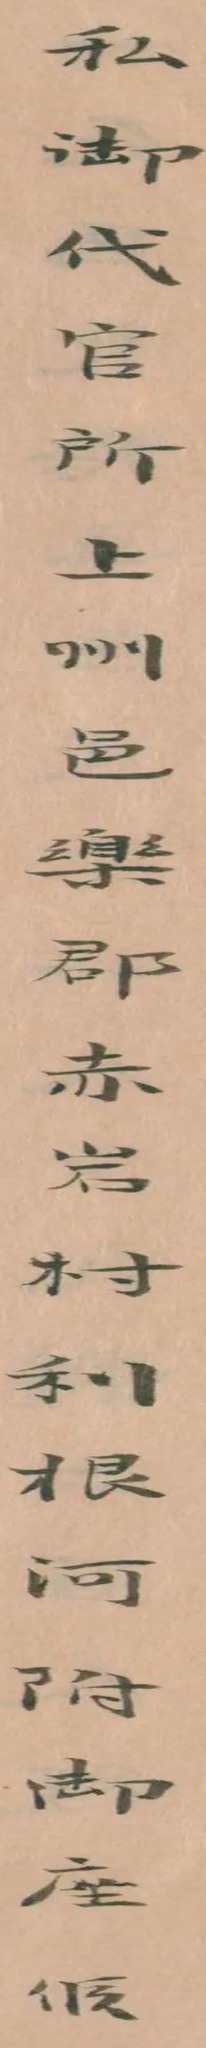私御代官所上州邑楽郡赤岩村利根河附御座候
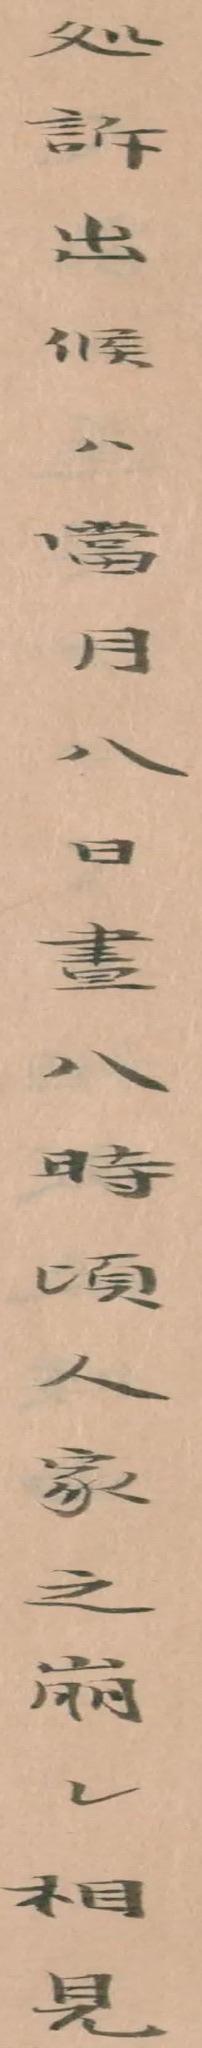処訴出候ハ当月八日晝八時頃人家之崩レ相見
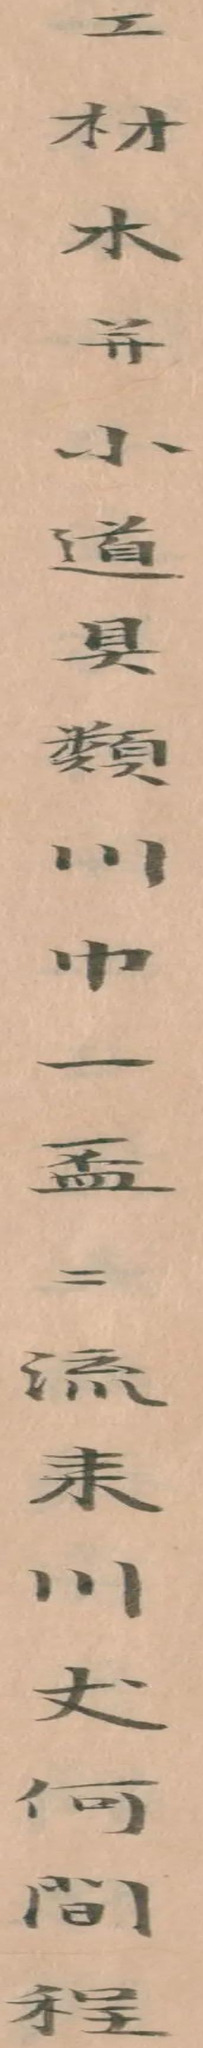エ材木并小道具類川中一盃二流来川丈何間程
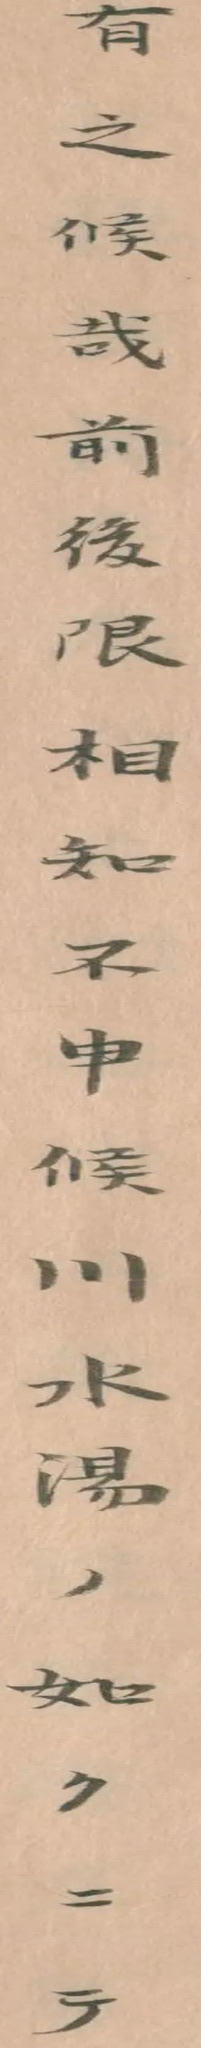有之候哉前後限相知不申候川水湯之如クニテ
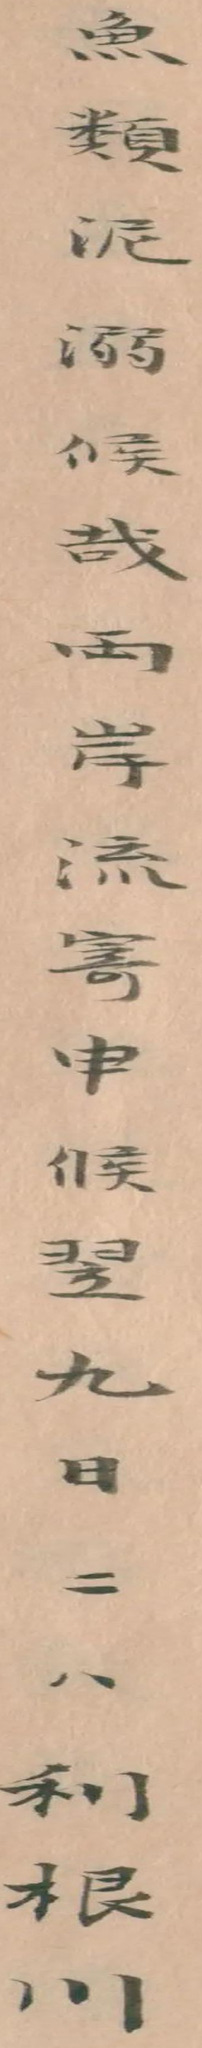魚類泥溺候哉両岸流寄申候翌九日ニハ利根川
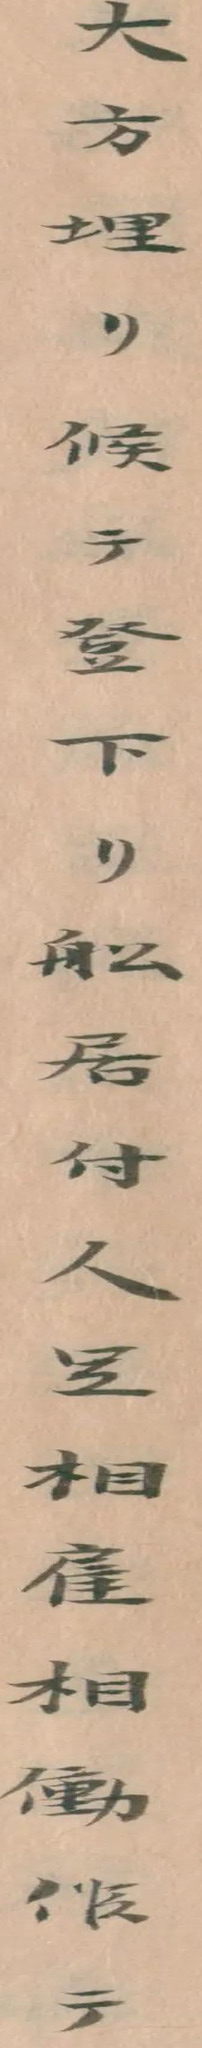大方埋り候テ登下り船居付人足相雇相働候テ
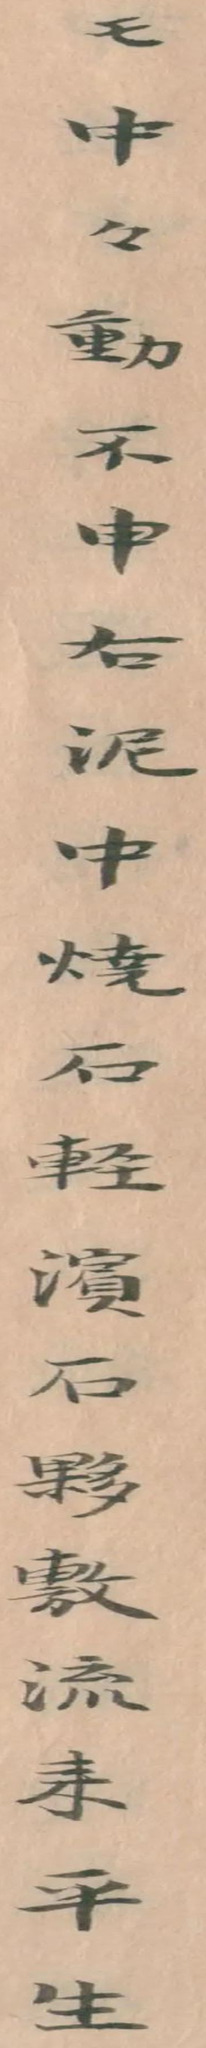モ中々動不申右泥中焼石軽濱石夥敷流来平生
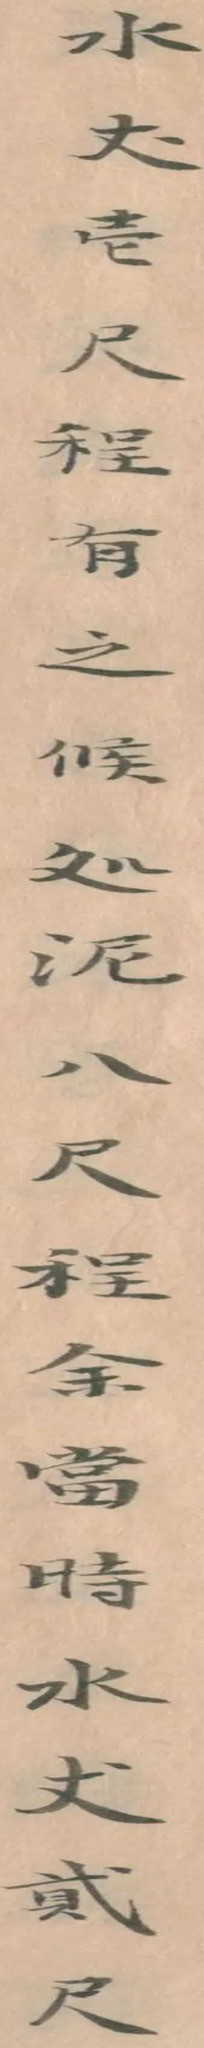水丈壱尺程有之候処泥八尺程余当時水丈弐尺
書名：地災撮要. 巻1(噴火山・地震ノ部)
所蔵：国立国会図書館 National Diet Library, JAPAN
